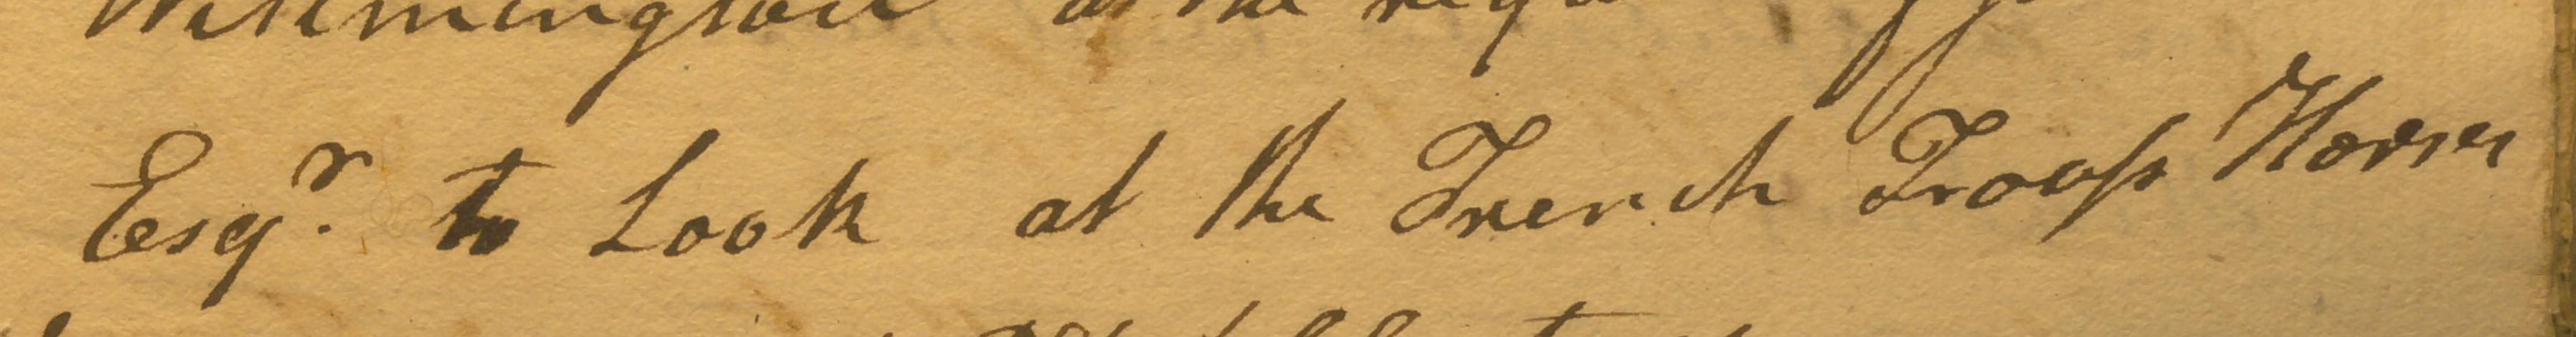Esq^r. to Look at the Trench Troop Horses
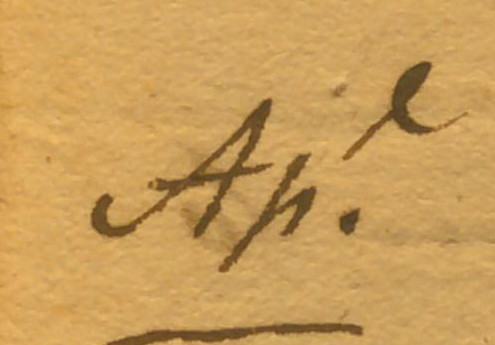Ap^l.
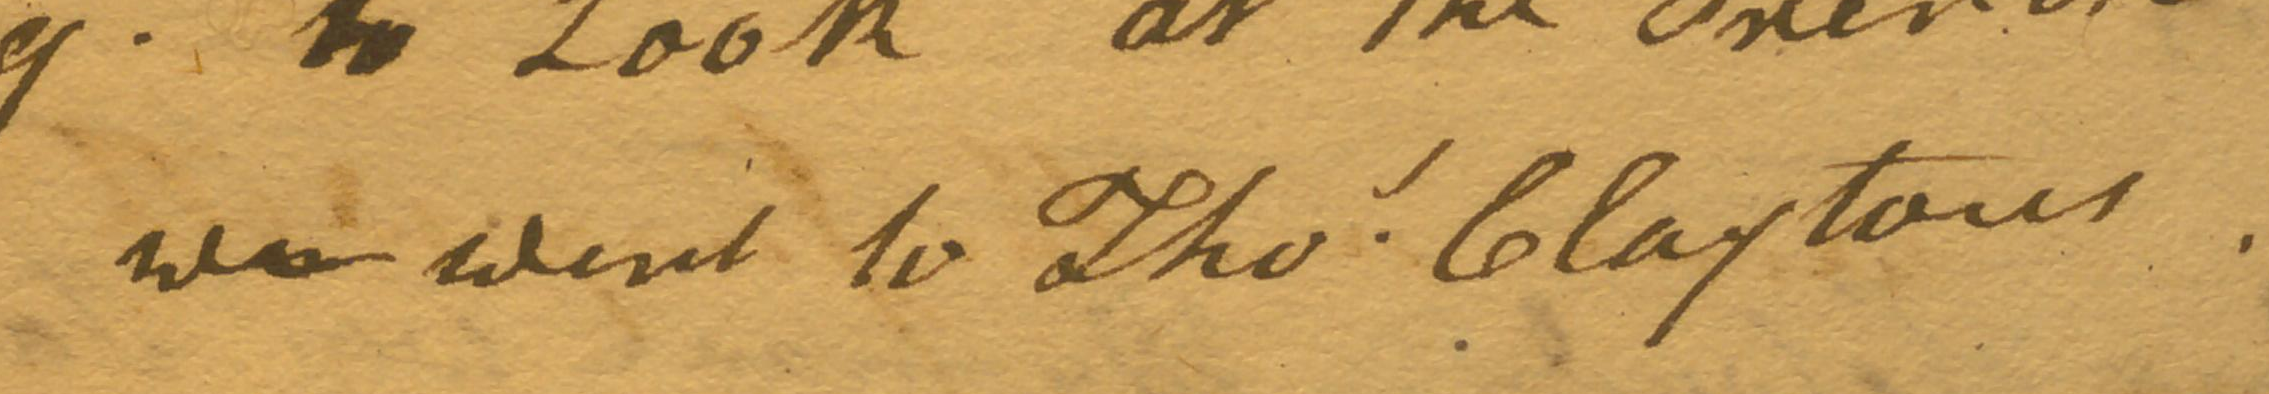we went to Tho^s. Claytons
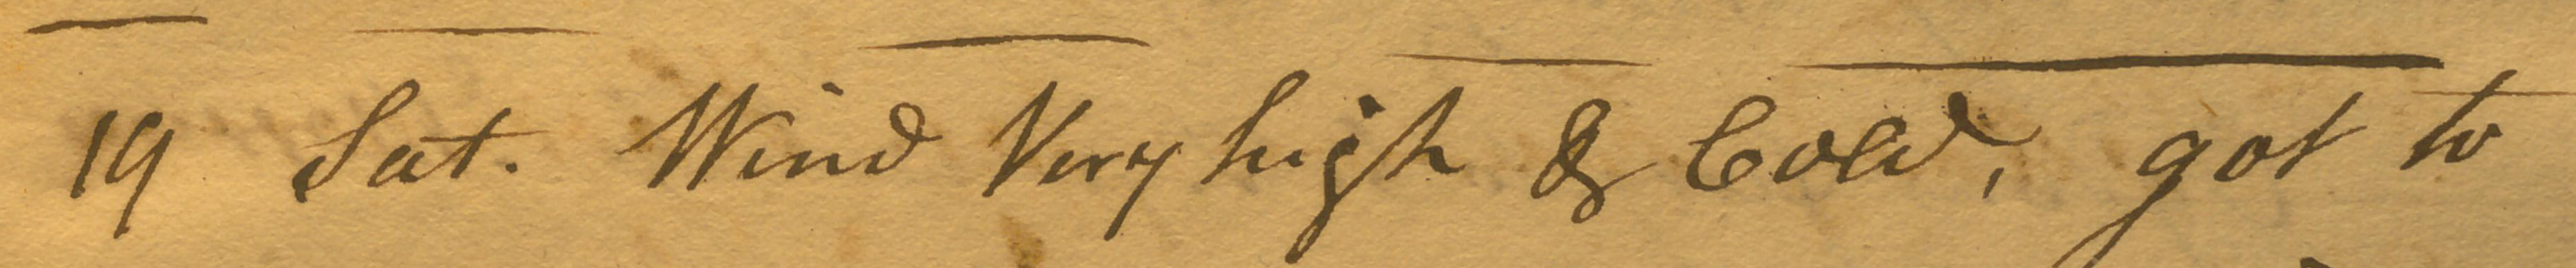19 Sat. Wind Very high & Cold, got to
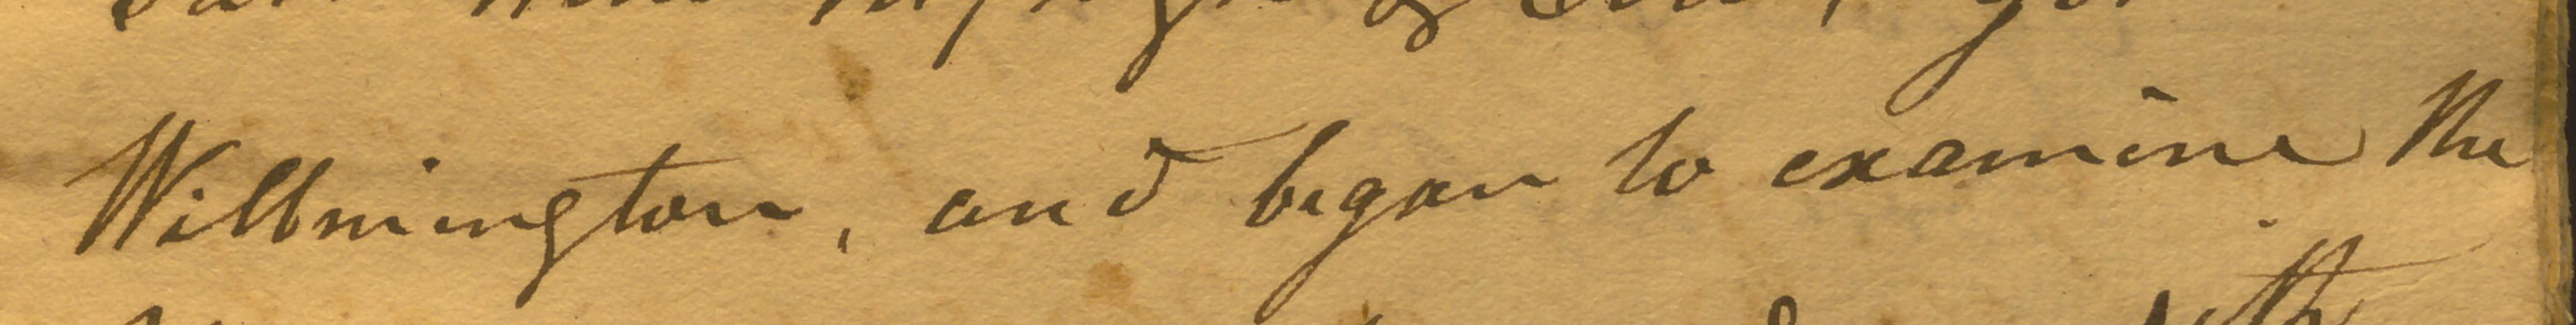Willmington, and began to examine the
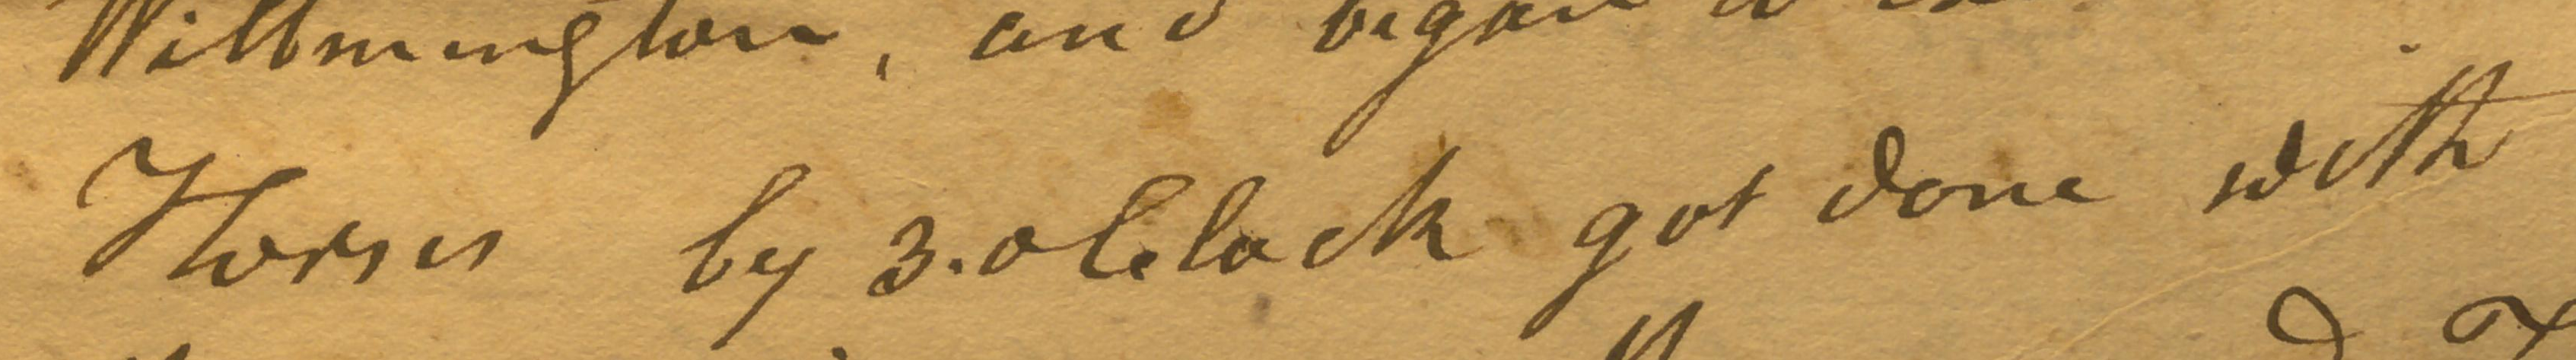Horses by 3 oClock got done with
